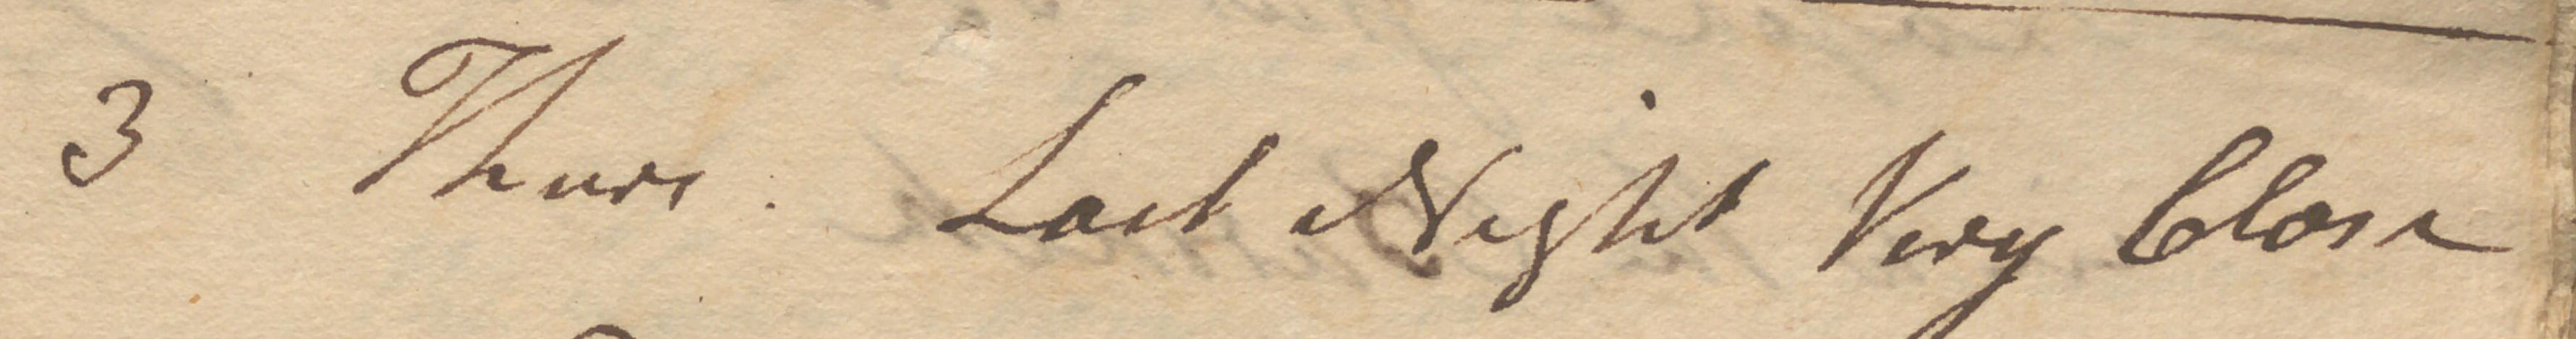3 Thurs Last Night Very Close
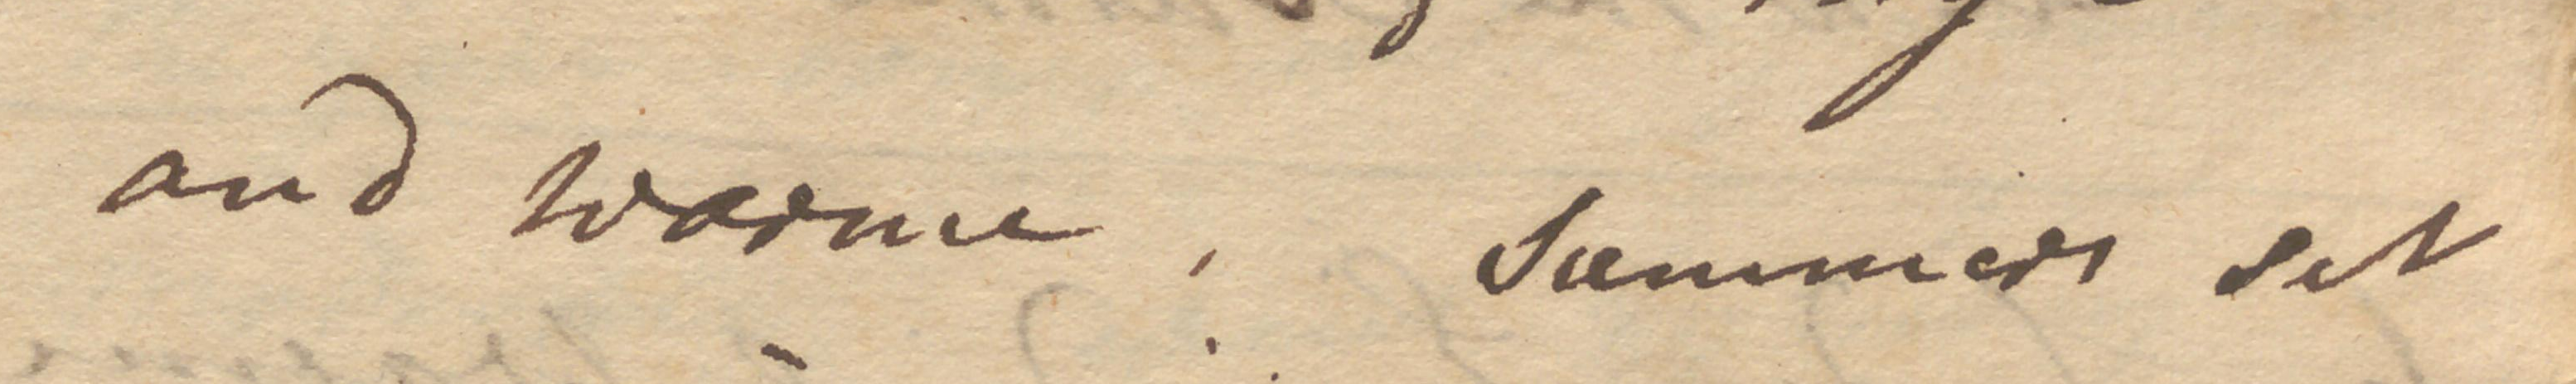and warme. Summers set
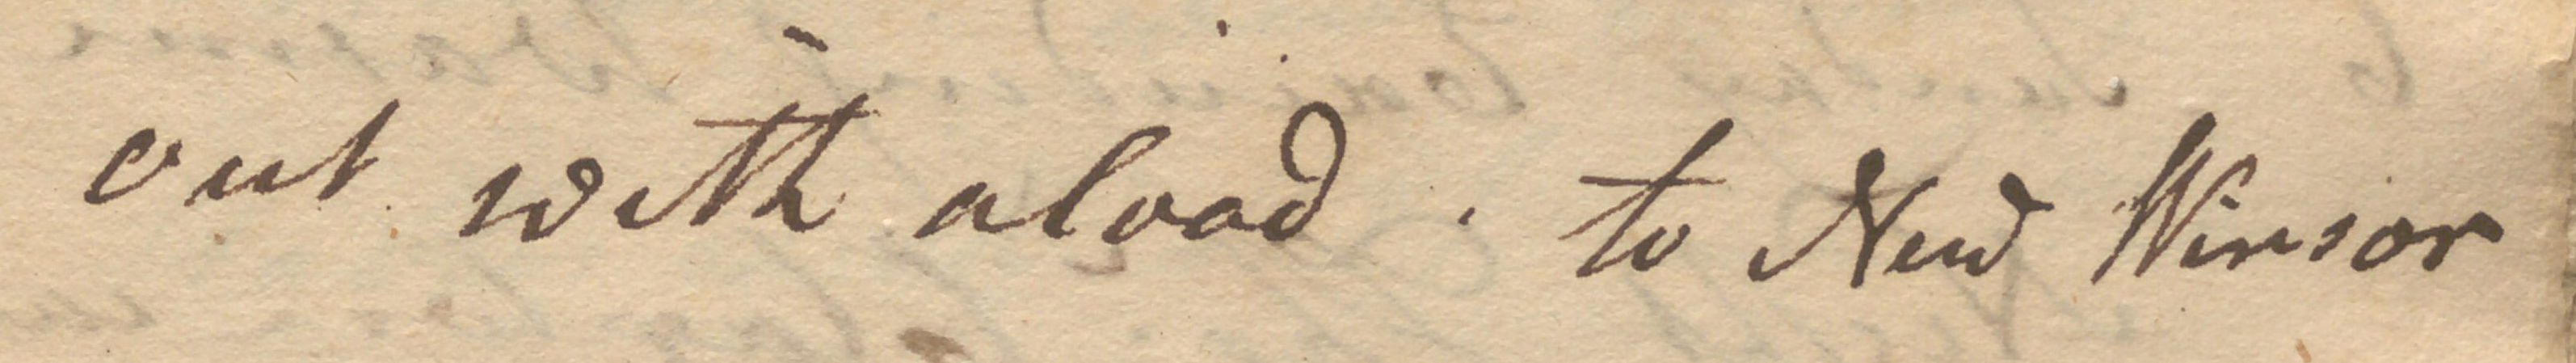out with a load. to New Winsor
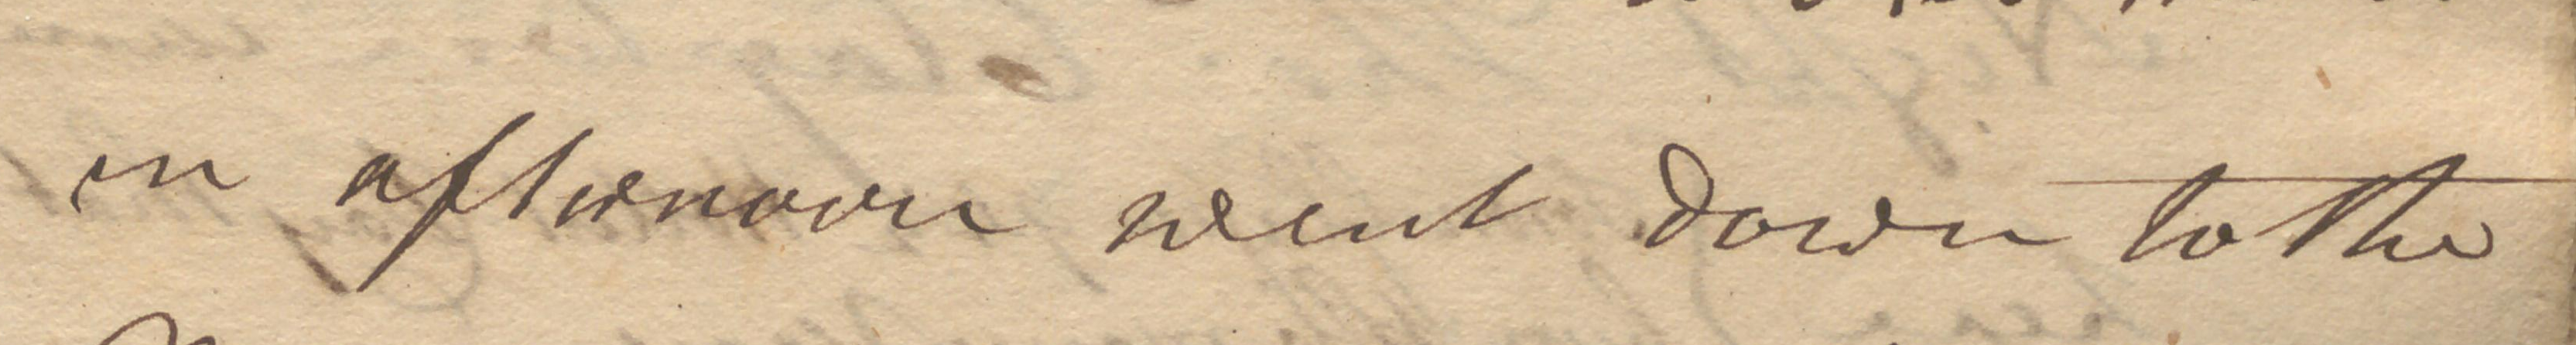in afternoon went down to the
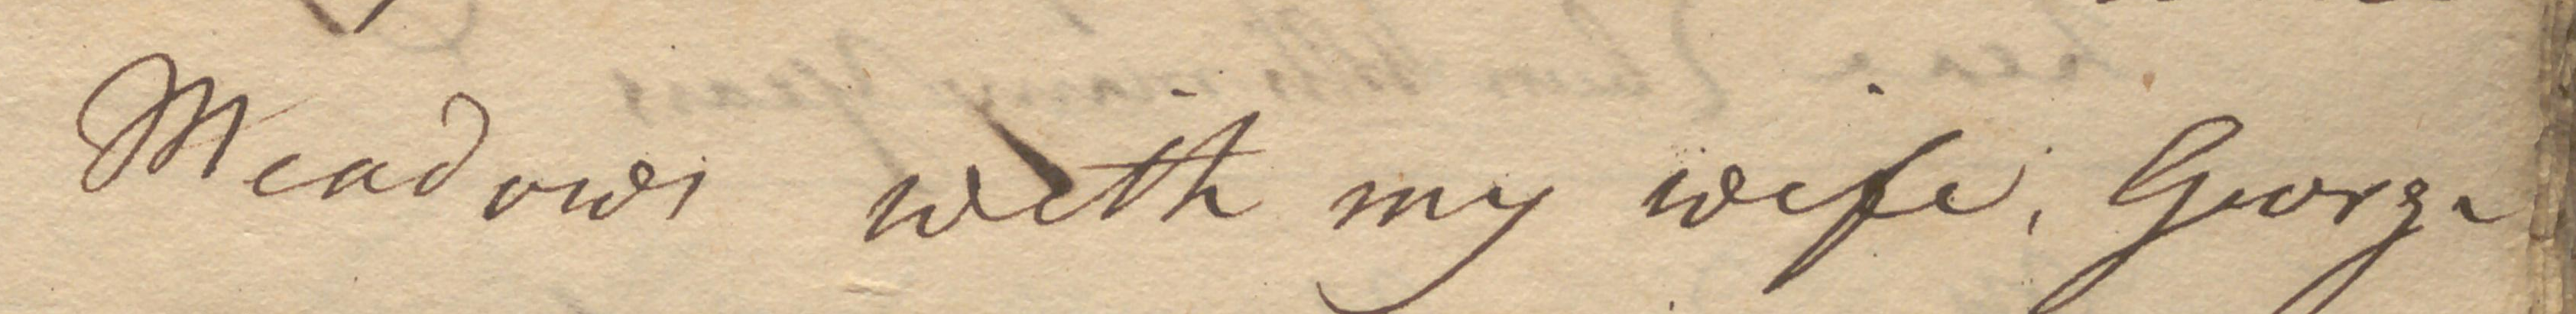Meadows with my wife. George
